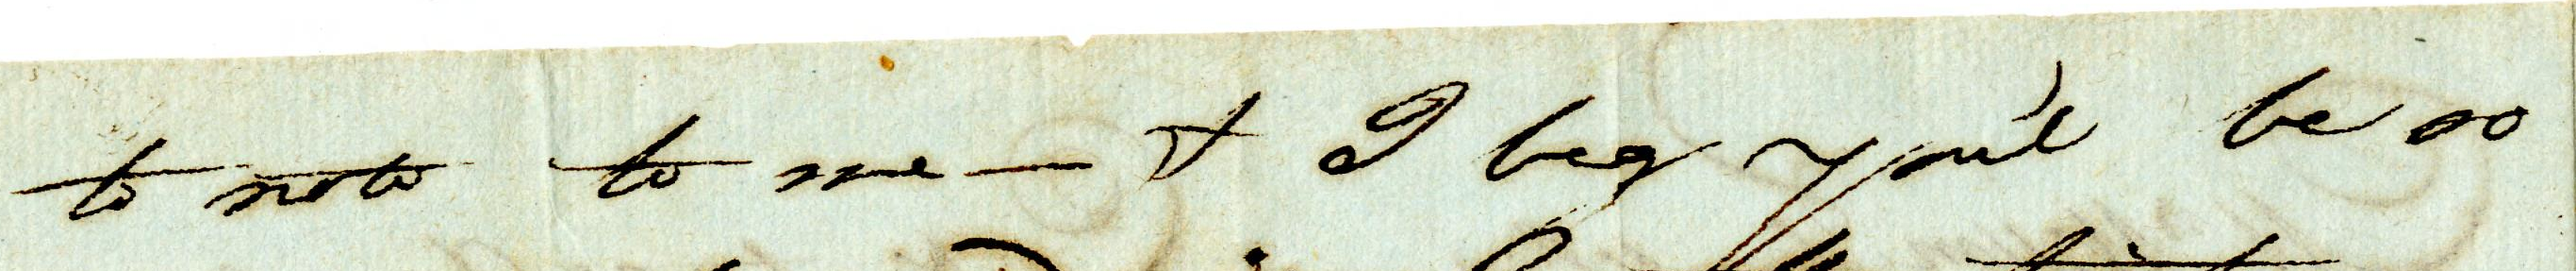to note to me- & I beg you'l be so
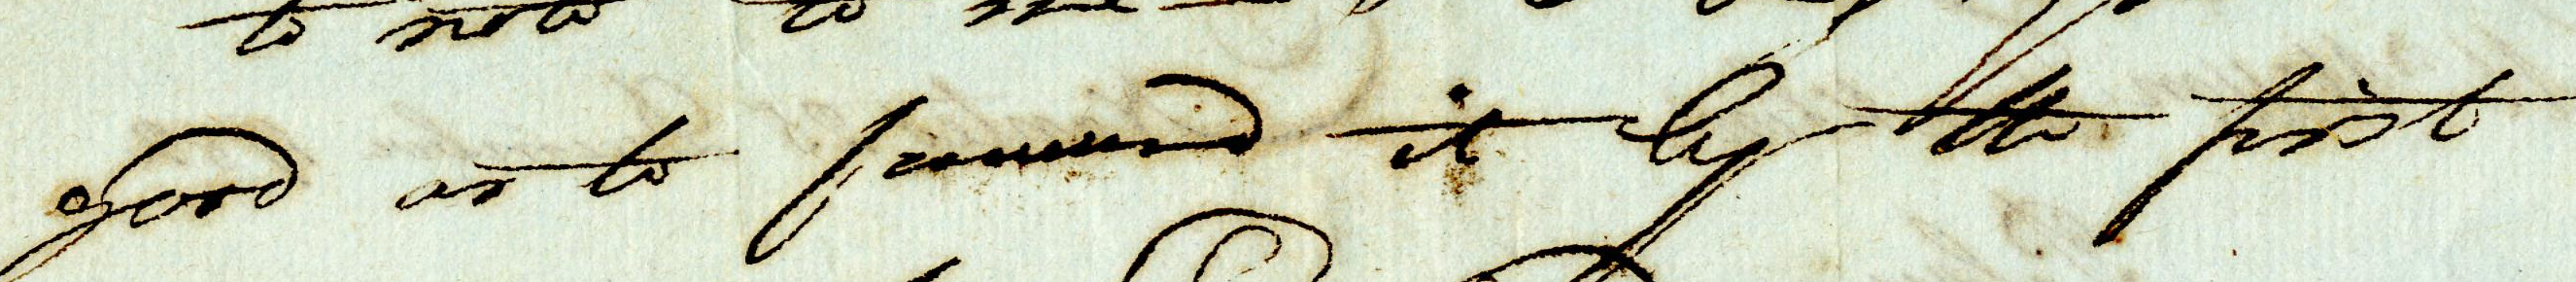good as to forward it by the first
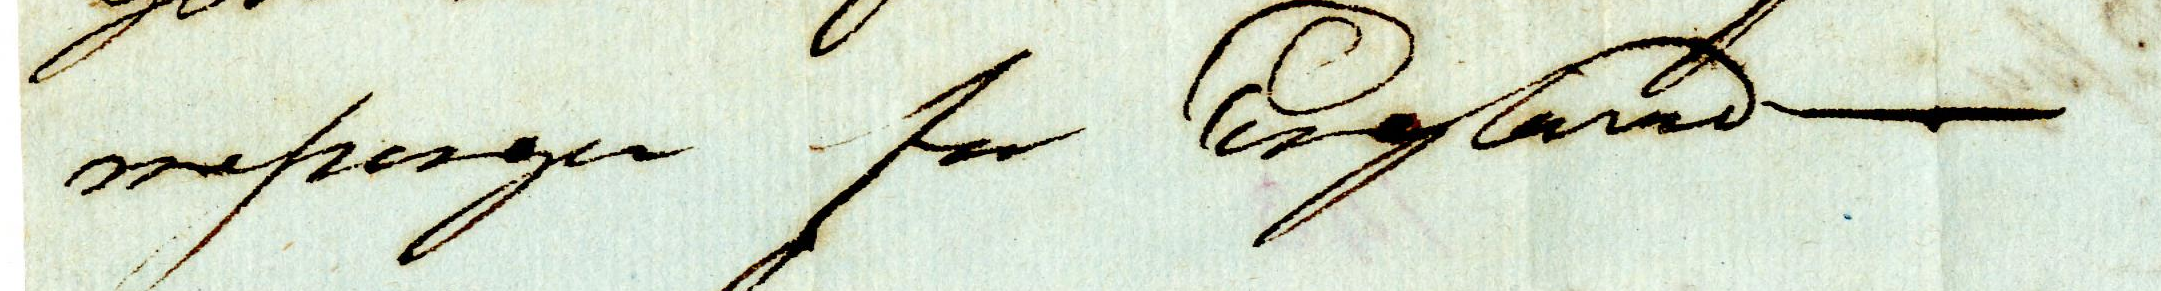messenger for England-
